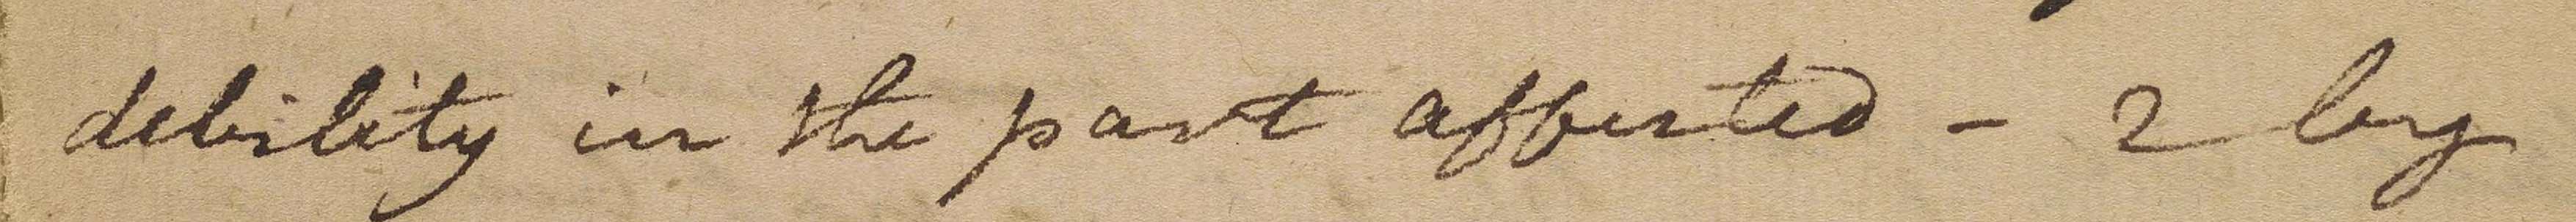debility in the past affected- 2 by
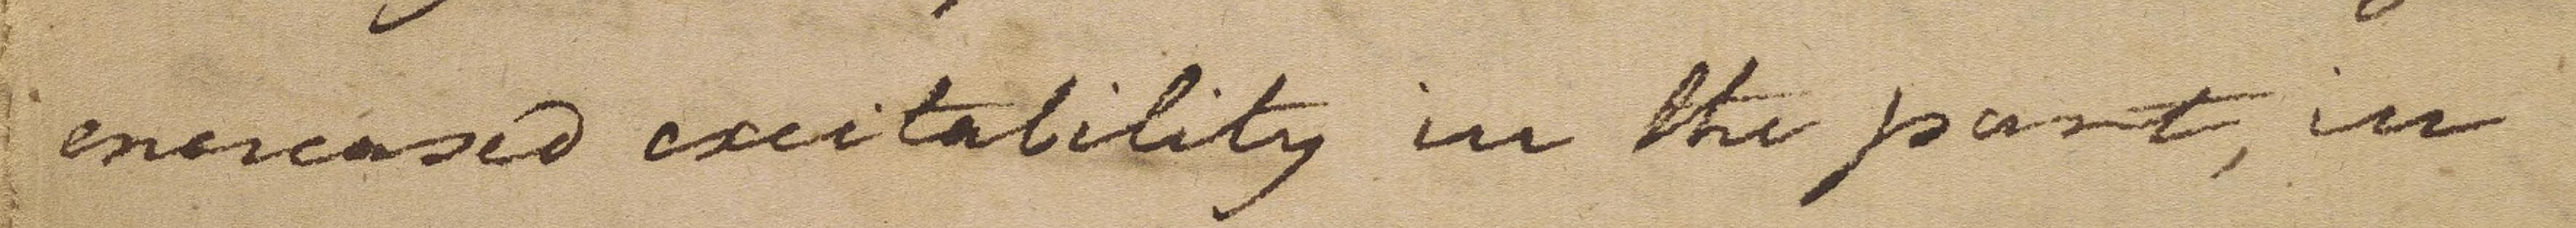encreased excitability in the part, in
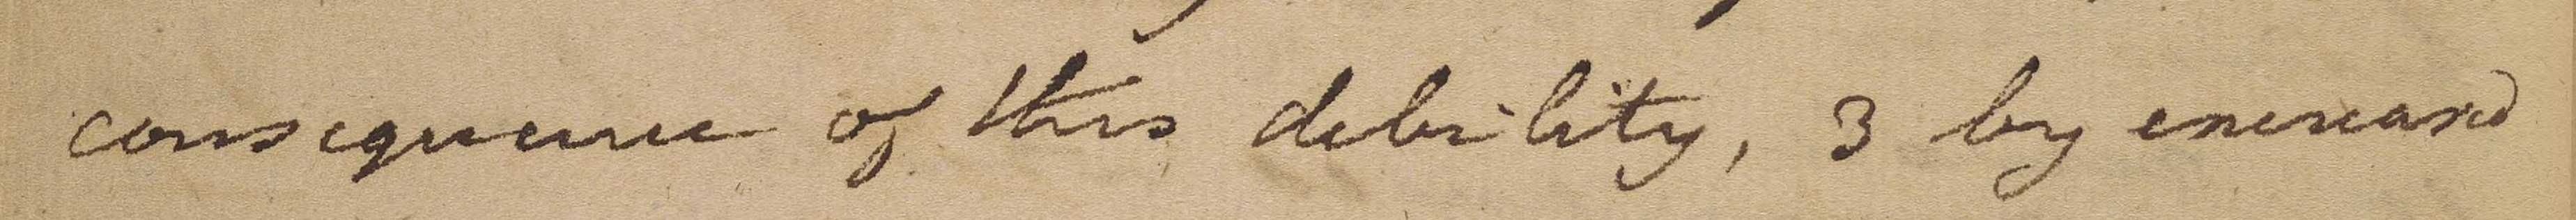consequence of this debility, 3 by encreased
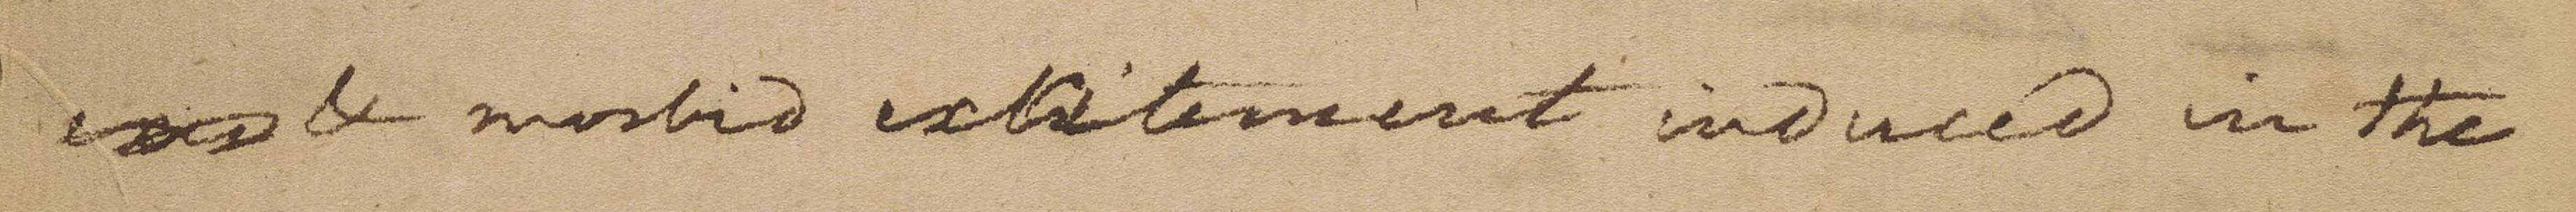& morbid excitedment induced in the
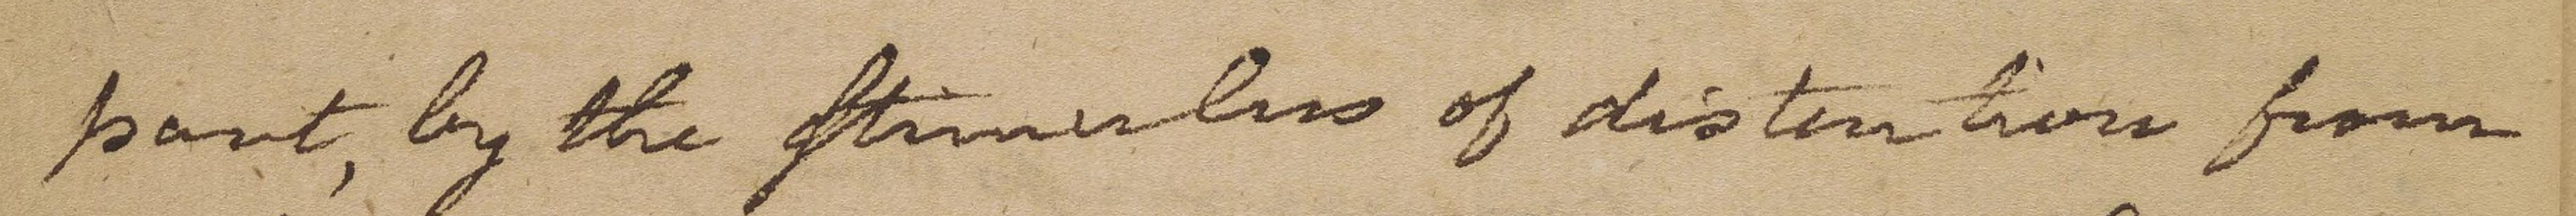part by the Stimulus of distentions from
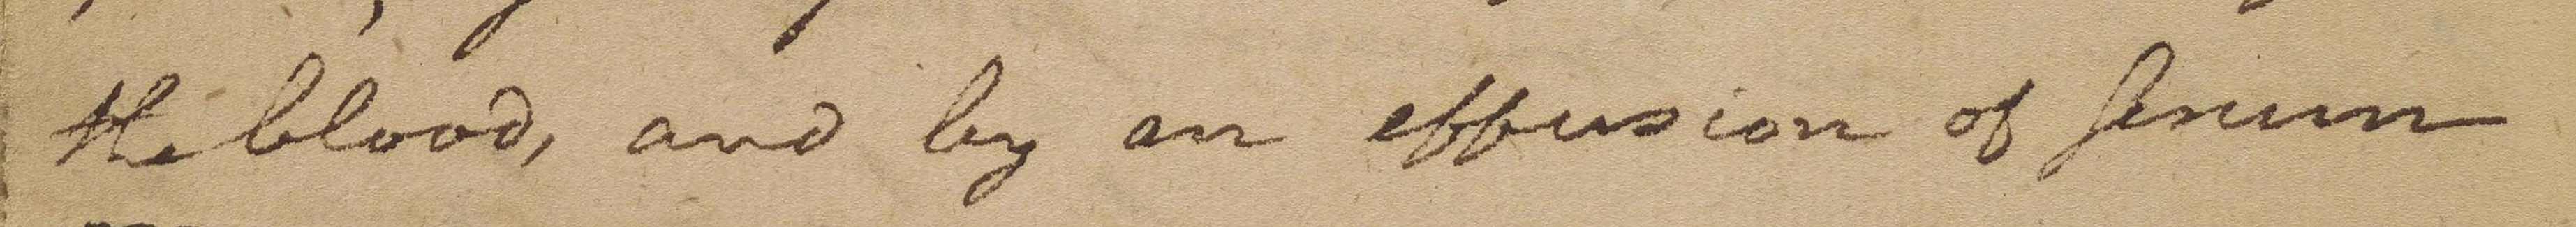the blood, and by an effusion of Serum
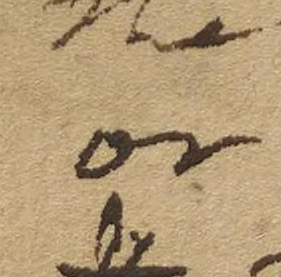or
